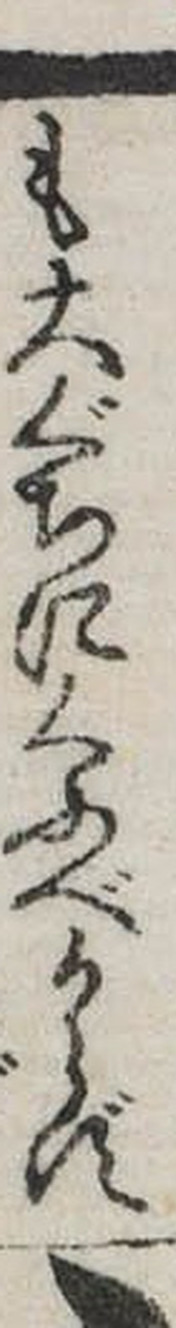も大ぐちにくふべからず
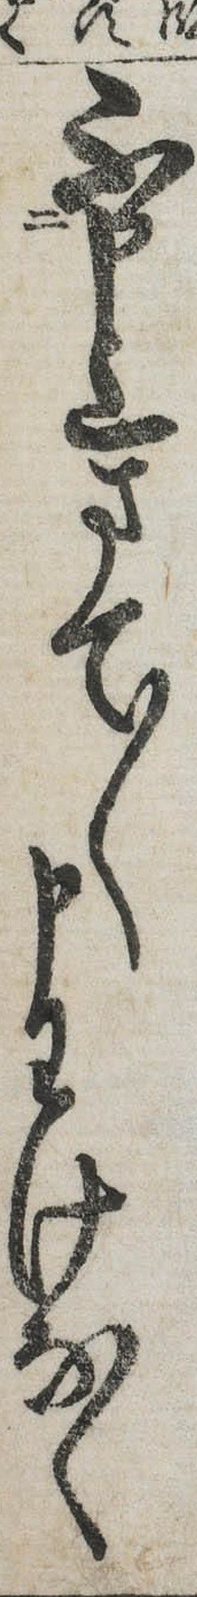不申上さて〳〵申わけなく

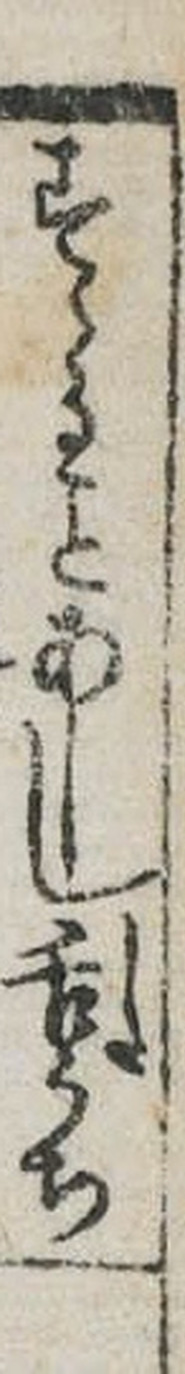すゝることあしし舌うち
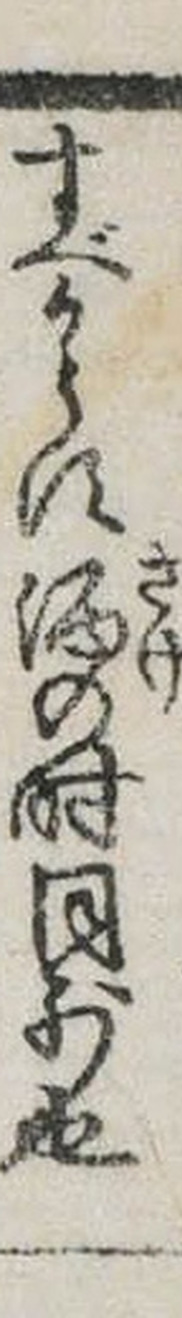すべからす酒の時同前也
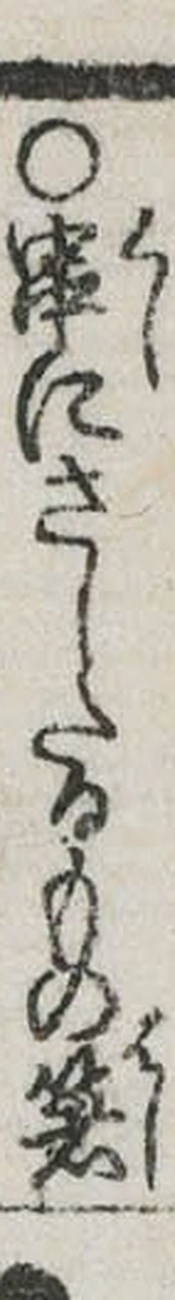○串にさしたるもの箸
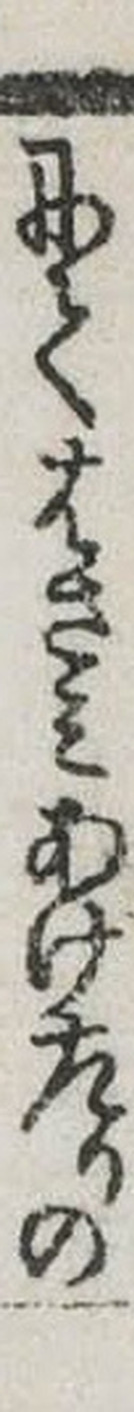にてはさみあげ左りの
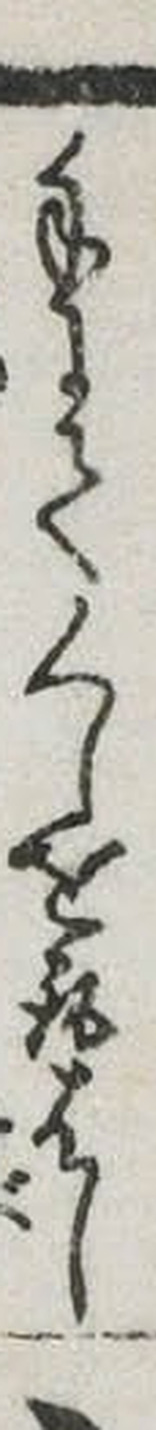手にてくしを取はし
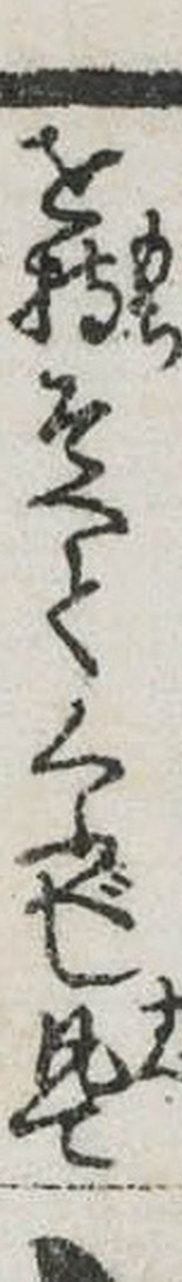を持そへてくふべし凡て
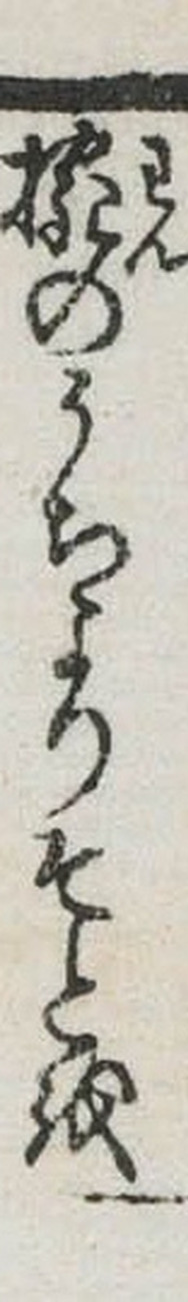椀のうちよりそとを
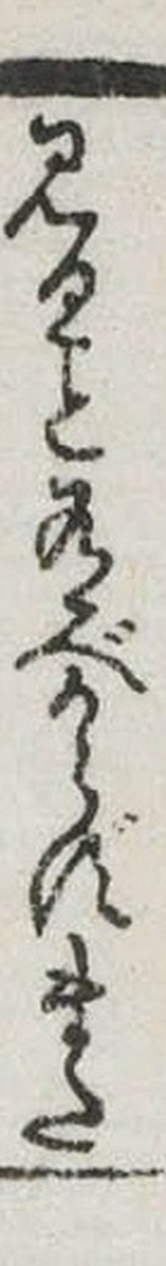見ること有べからずまた
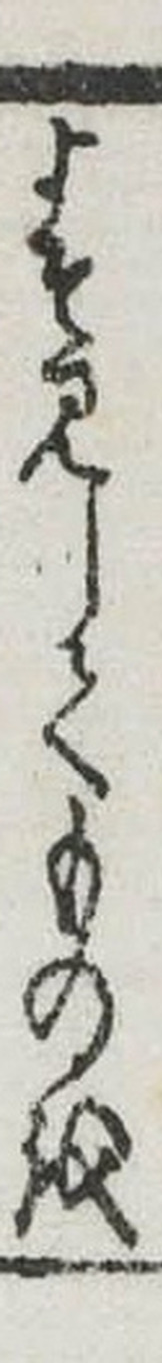よそ見してものを
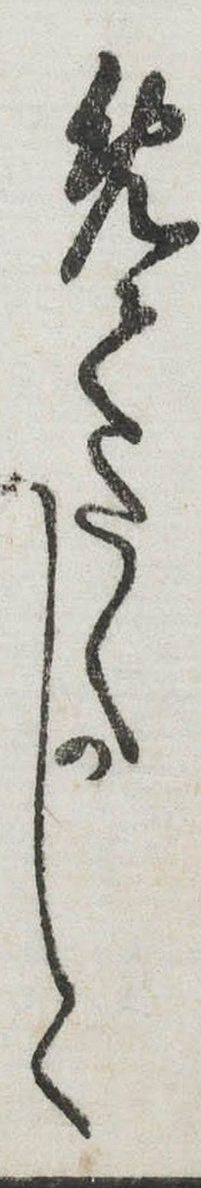めてたくかしく
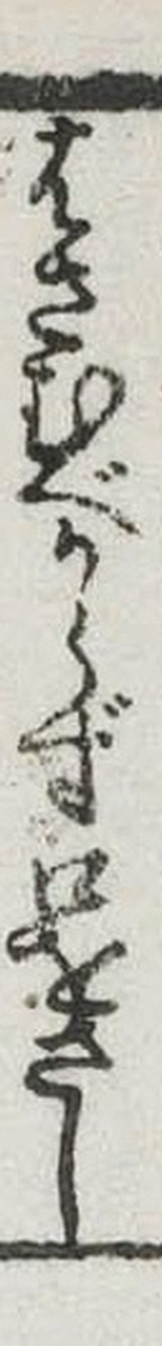はさむべからず口をさし
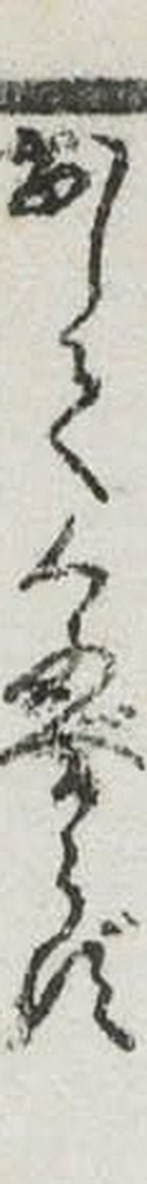出してくふべからず
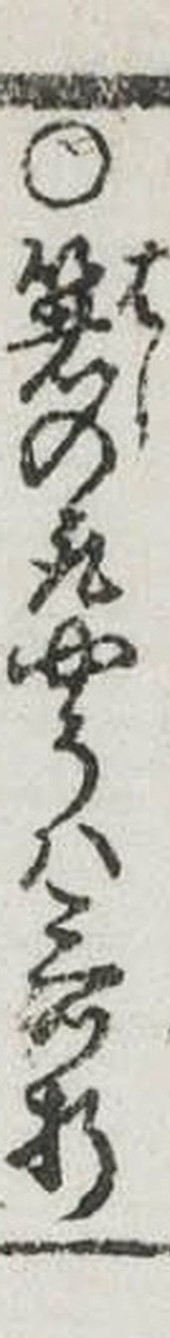○箸の取やうは三ッ折
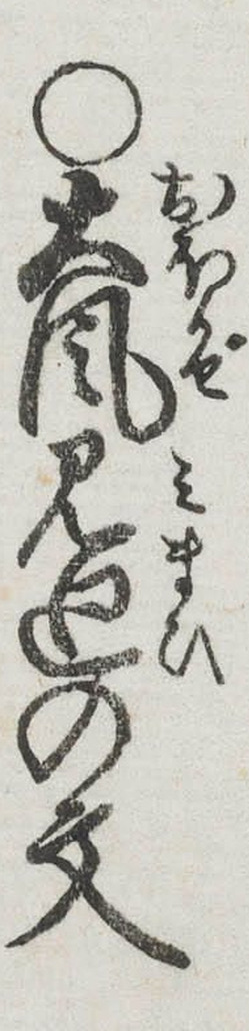○大風見廻の文
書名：頭書萬用婦人手紙之文言
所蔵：東京学芸大学教育コンテンツアーカイブ
